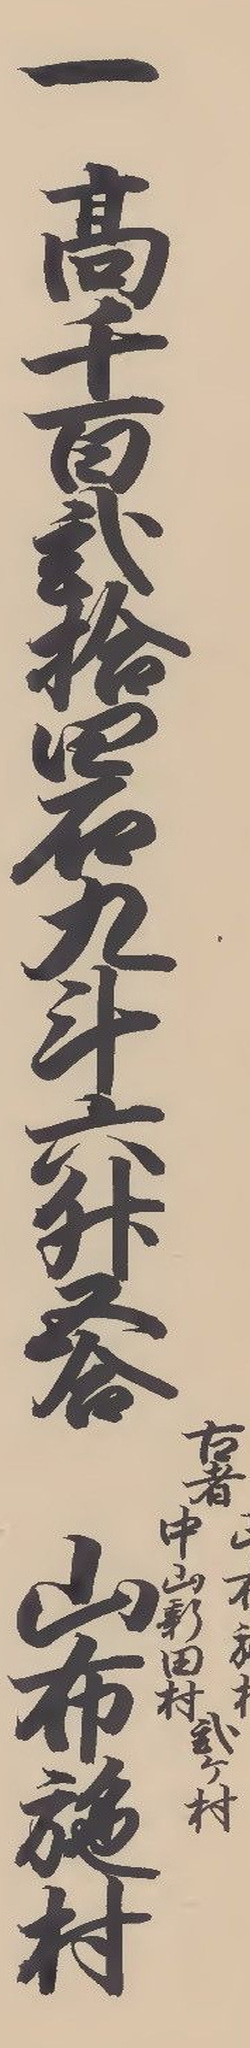一高千百弐拾四石九斗六升五合山布施村
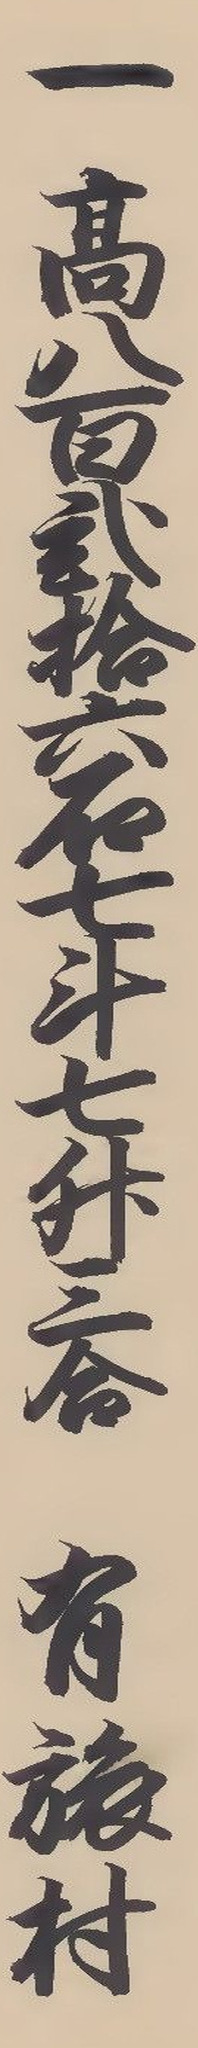一高八百弐拾六石七斗七升三合有旅村
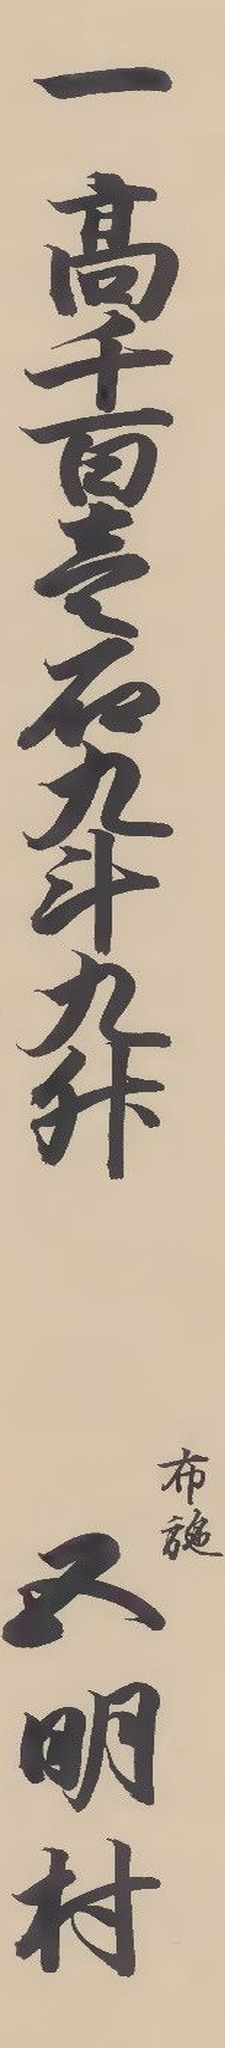一高千百壱石九斗九升五明村
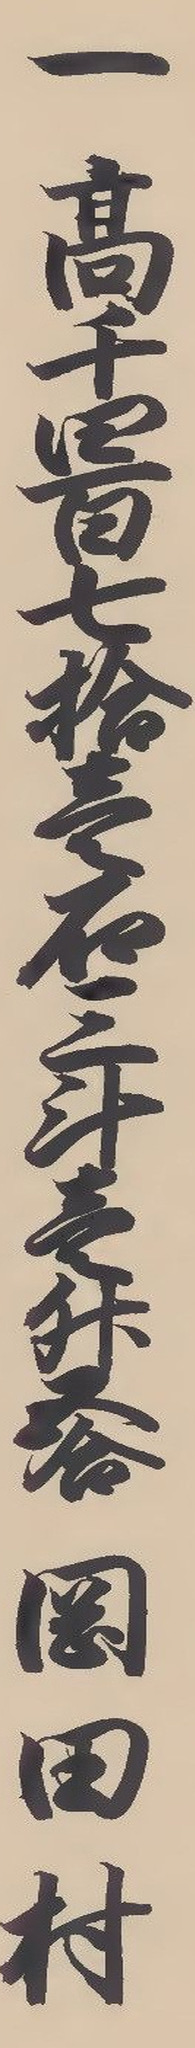一高千四百七拾壱石三斗壱升五合岡田村
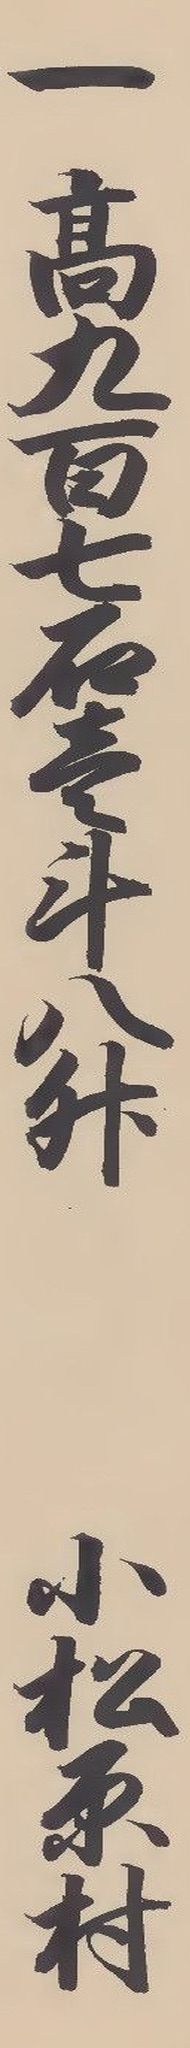一高九百七石壱斗八升小松原村
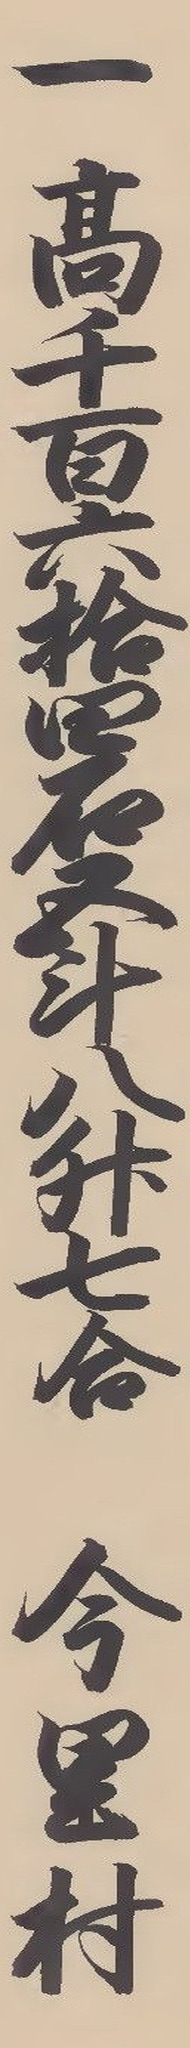一高千百六拾四石五斗八升七合今里村
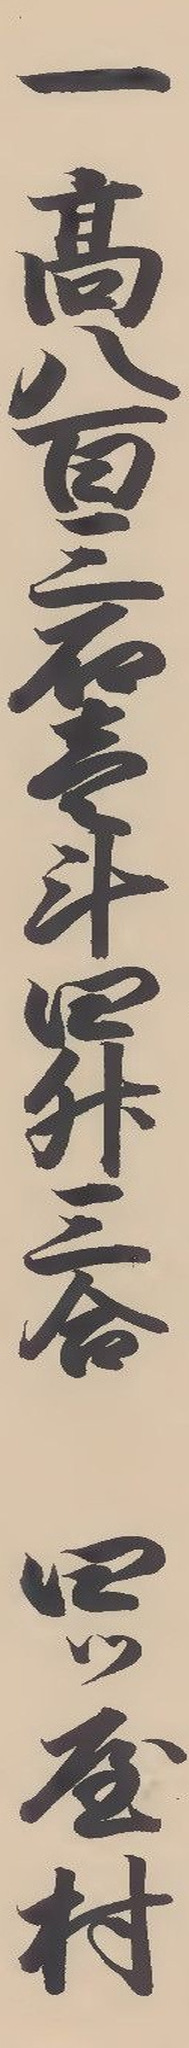一高八百三石壱斗四升三合四ツ屋村
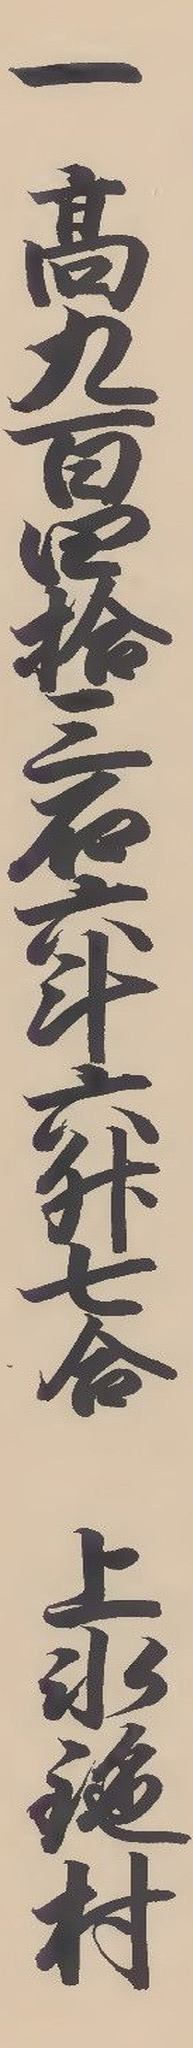一高九百四拾三石六斗六升七合上氷鉋村

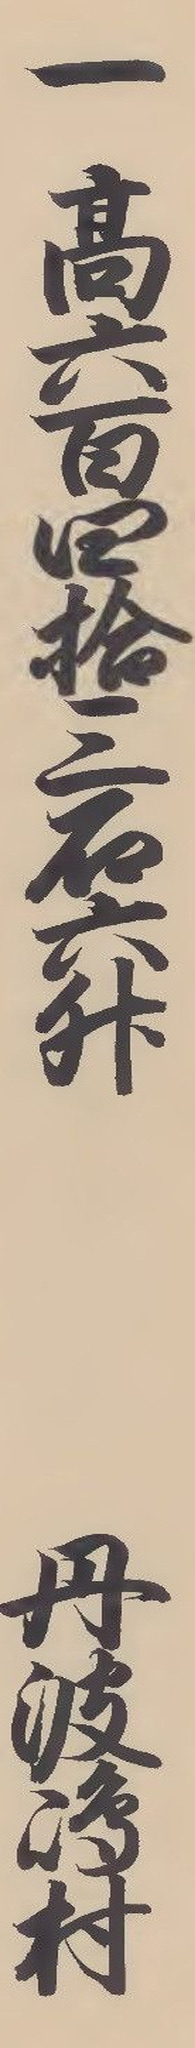一高六百四拾三石六升丹波島村
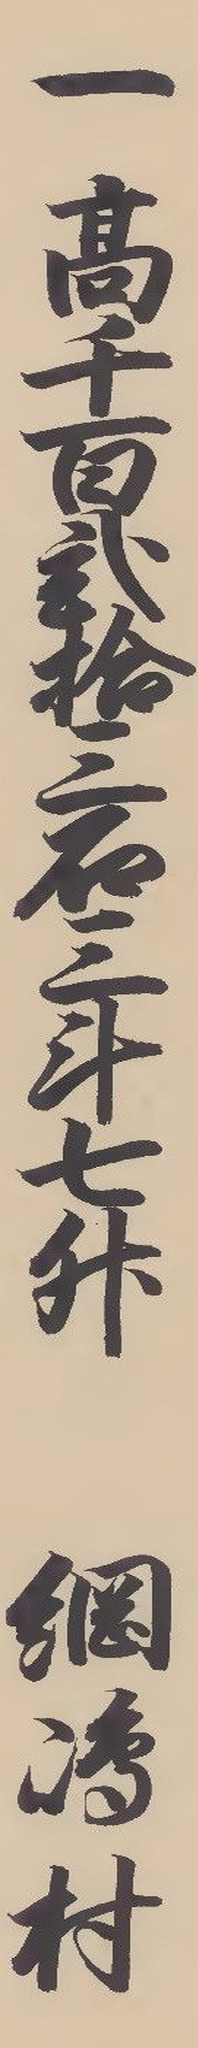一高千百弐拾三石三斗七升綱島村
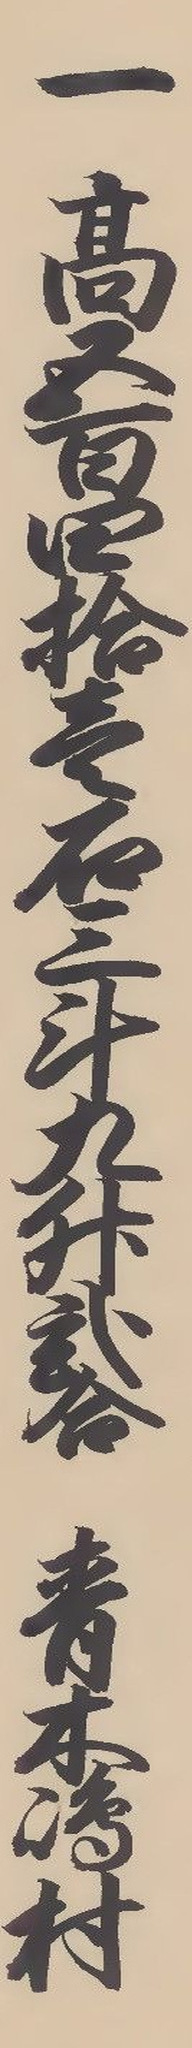一高五百四拾壱石三斗九升弐合青木島村
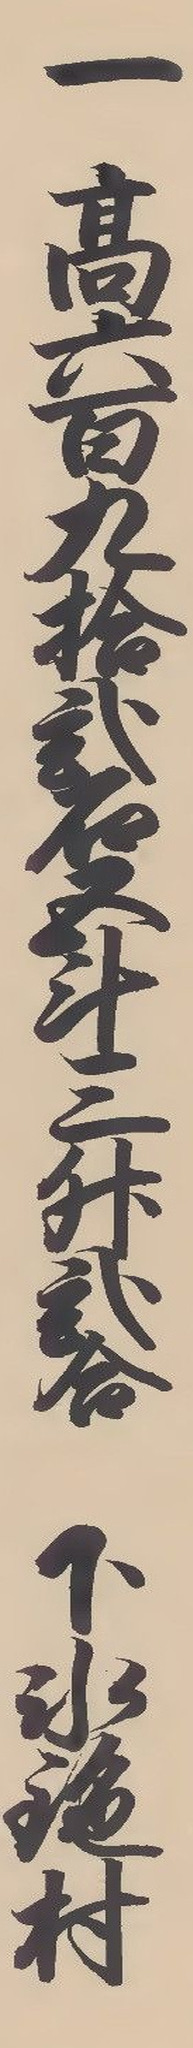一高六百九拾弐石五斗三升弐合下氷鉋村
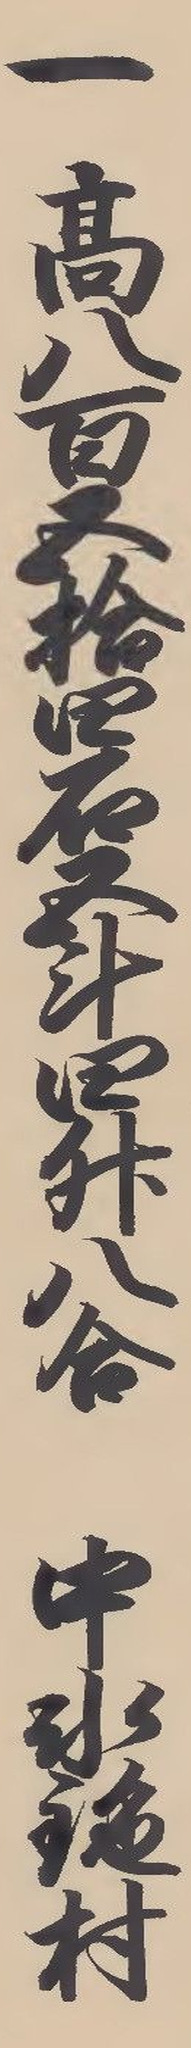一高八百五拾四石五斗四升八合中氷鉋村
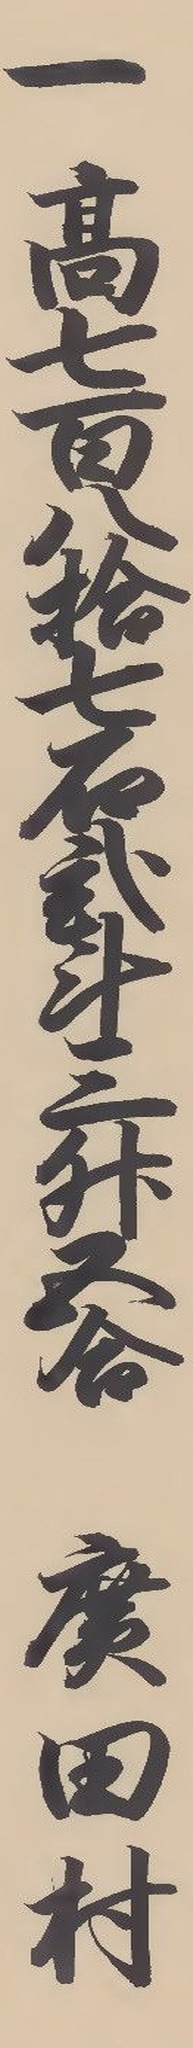一高七百八拾七石弐斗三升五合広田村
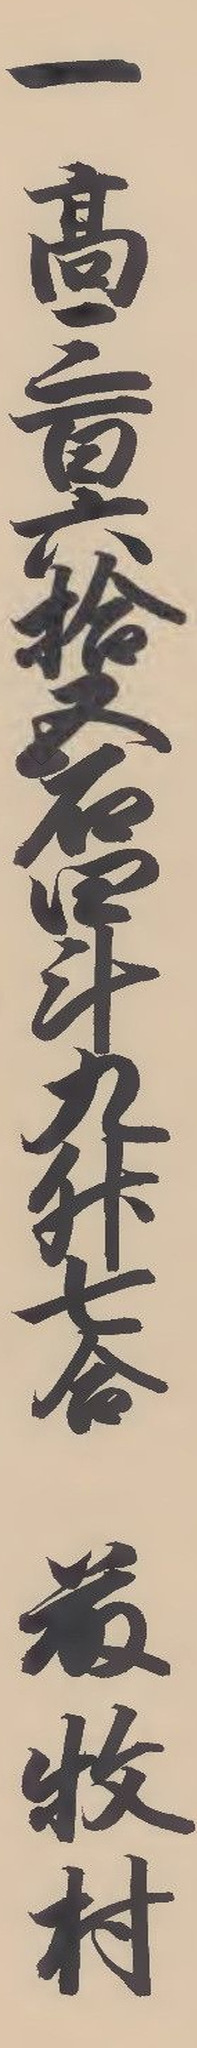一高三百六拾五石四斗九升七合藤枚村
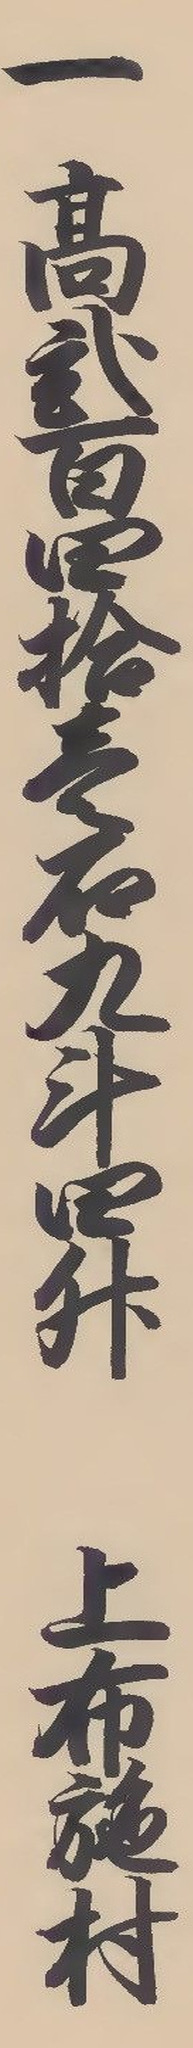一高弐百四拾壱石九斗四升上布施村
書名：信濃国郷帳
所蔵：国立公文書館 National Archives of Japan
